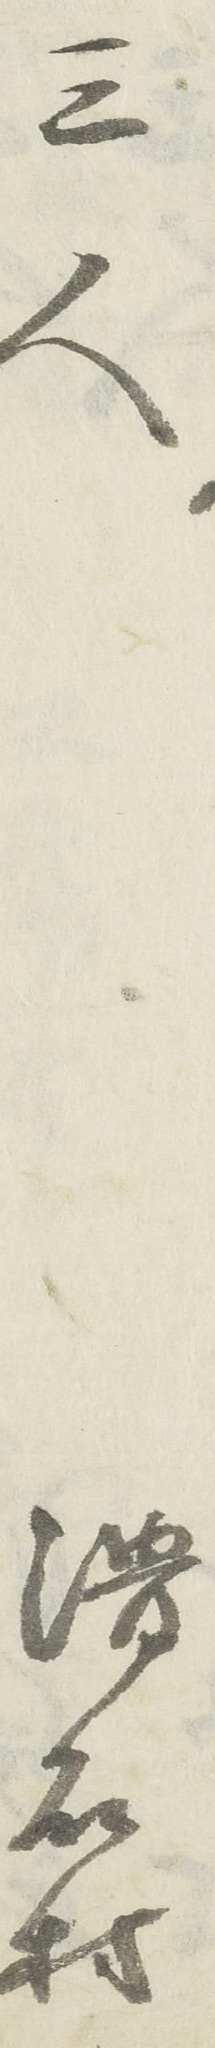三人滑石村
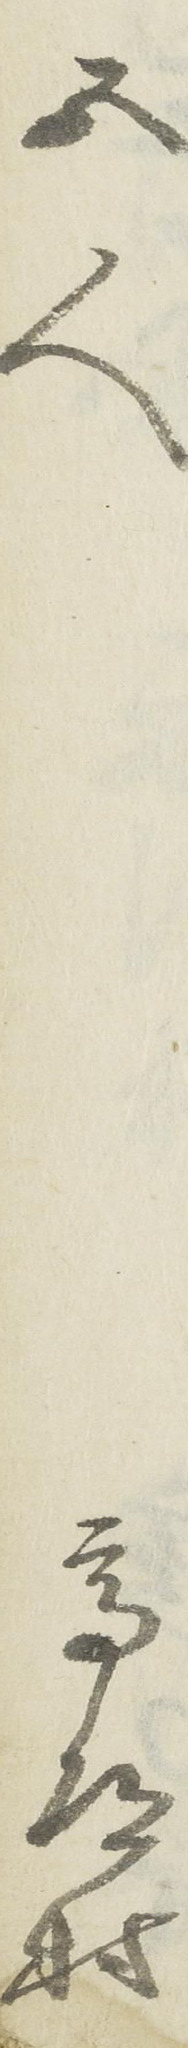五人高道村

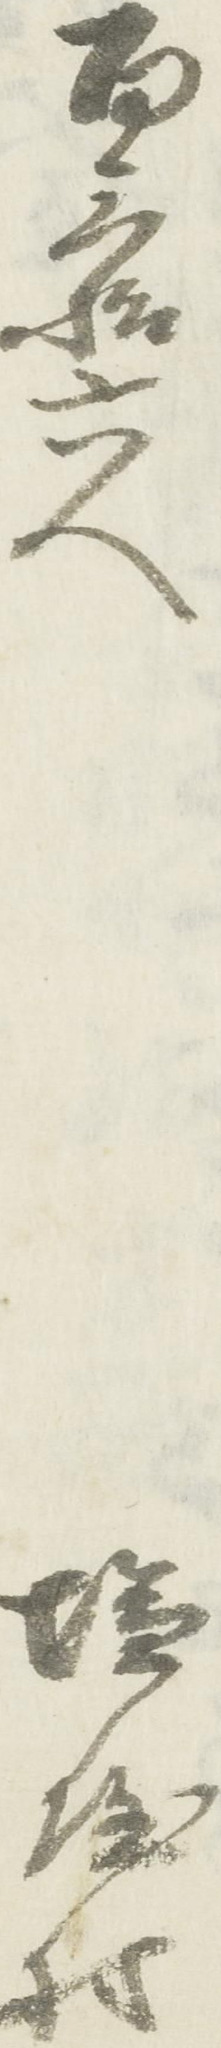百三拾六人塩屋村
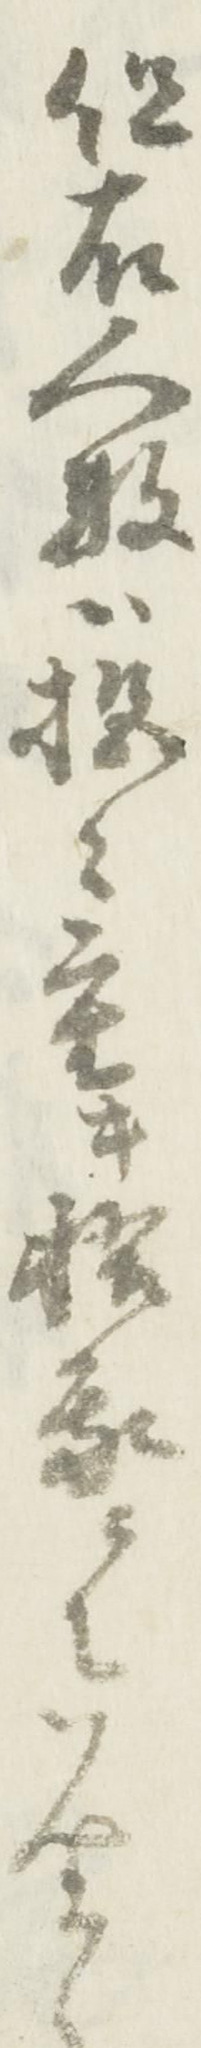但右人数ハ栬々重キ怪我ニて御座候
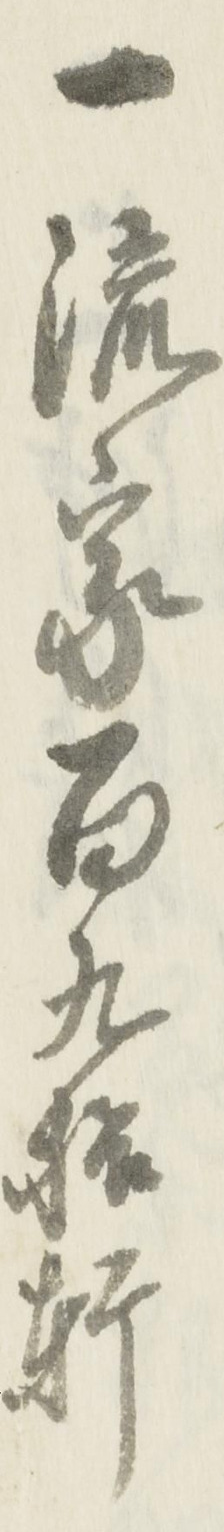一流家百九拾軒
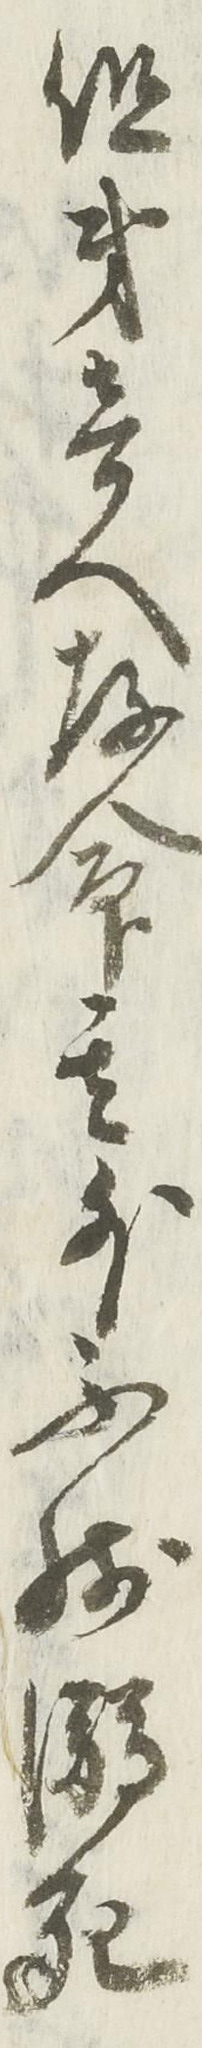但弟壱人存命其外不残死人
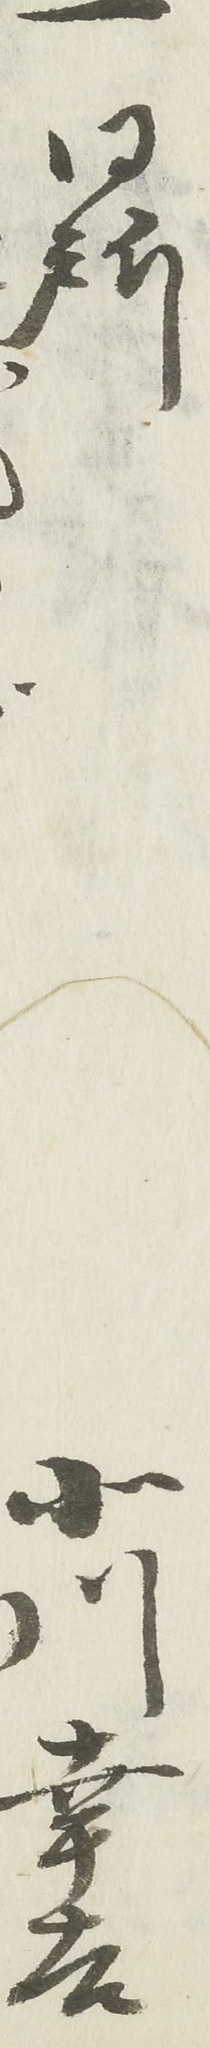一同所北川幸吉
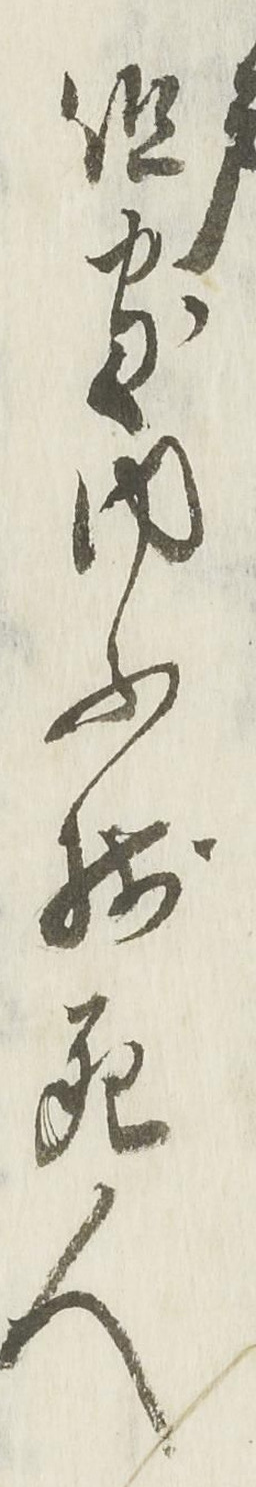但家内不残死人
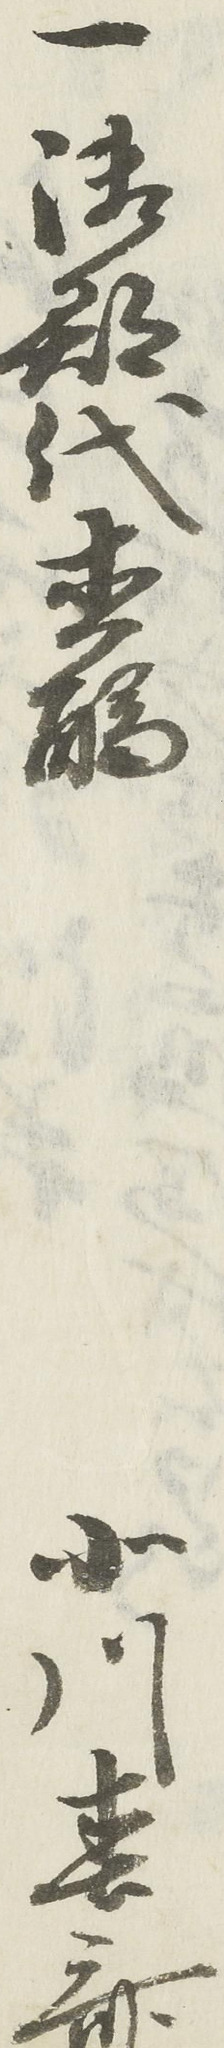一御郡代直触北川春斎
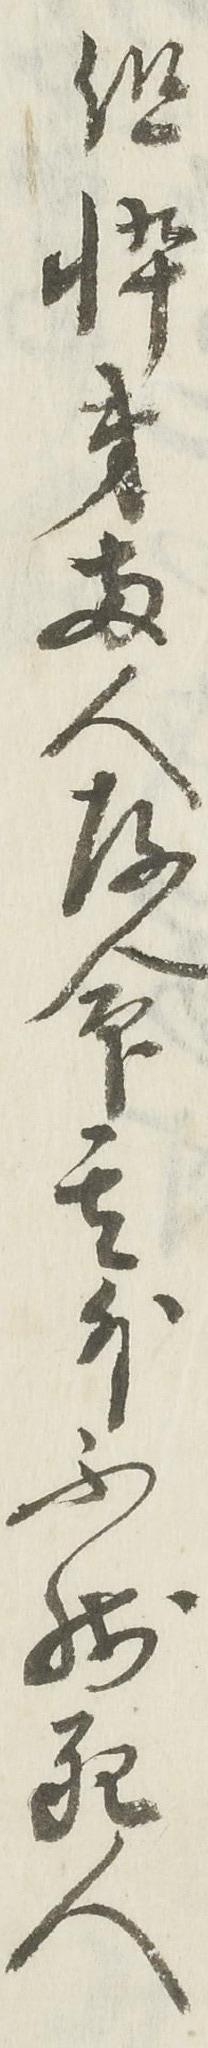但倅弟両人存命其外不残死人
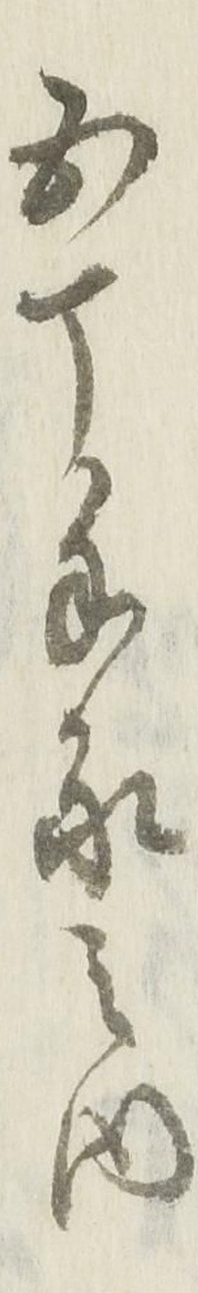五丁手永の内
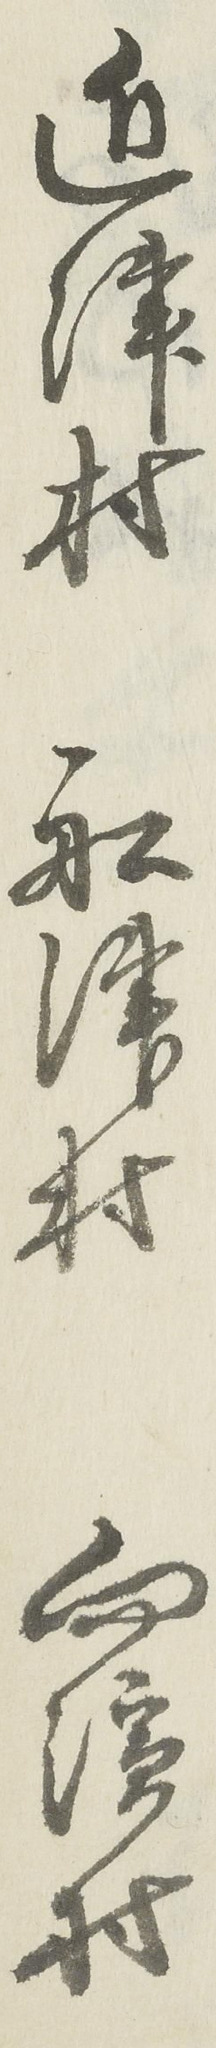近津村舩津村向浜村

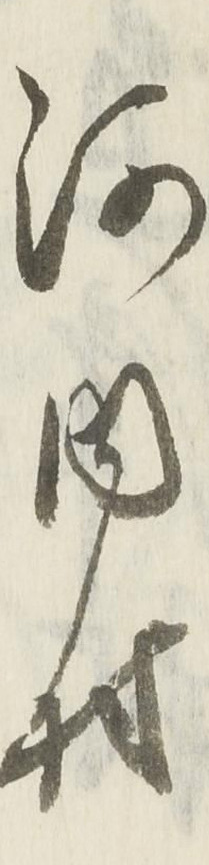河田村
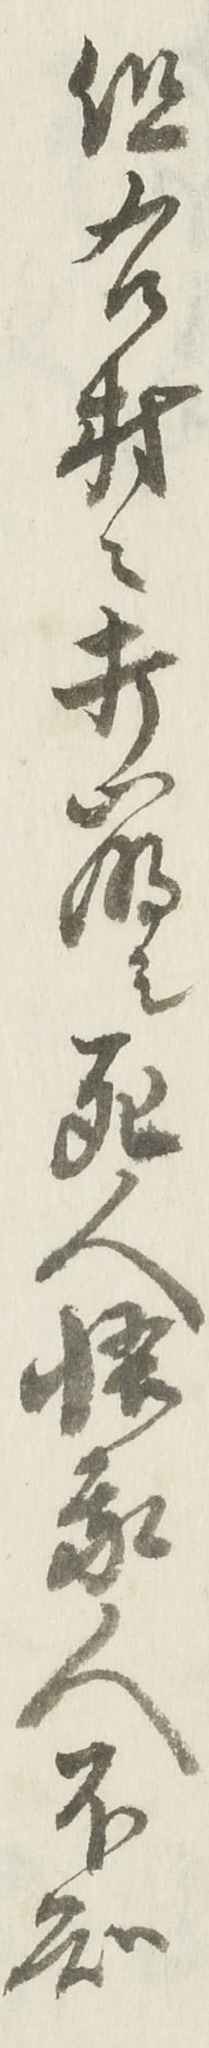但右村に打崩シ死人怪我人不知
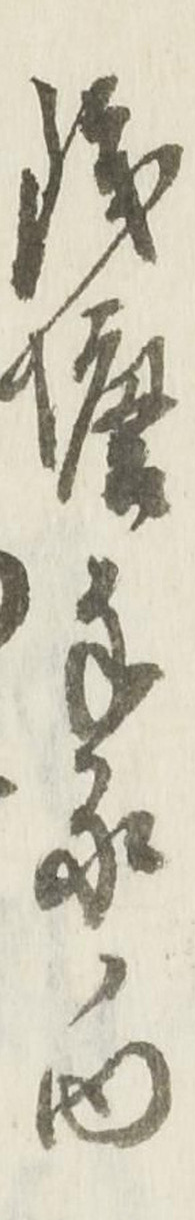浅塘手永ノ内
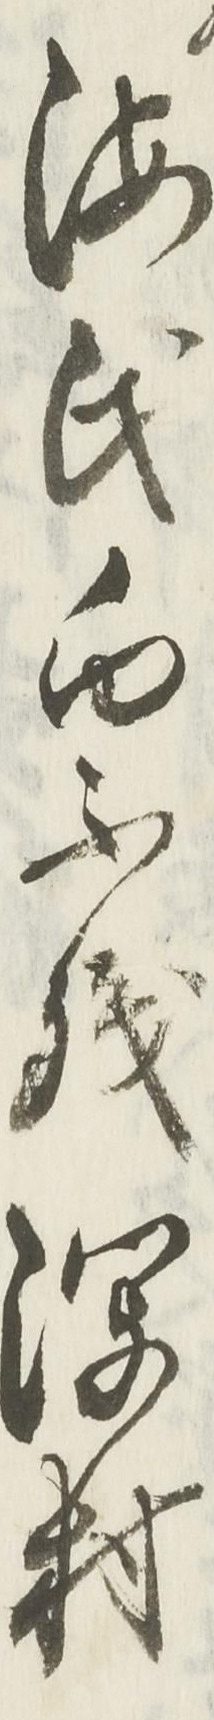海民白不残潟村
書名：後見笑
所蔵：東京大学地震研究所図書室 Earthquake Research Institute Library, The University of Tokyo, JAPAN
